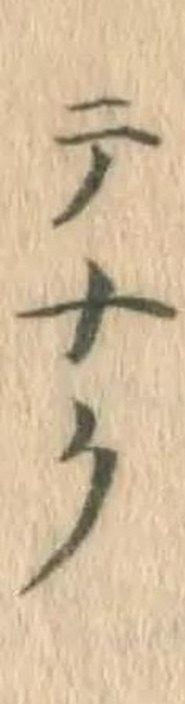テナク
